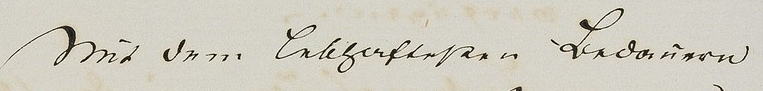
Mit dem lebhaftesten Bedauern
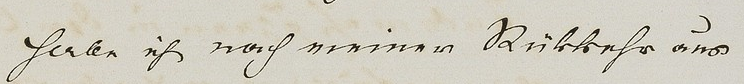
habe ich mich nach meiner Rükkehr aus
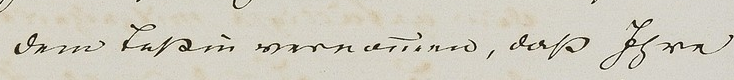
dem Teßin vernommen, daß Ihre
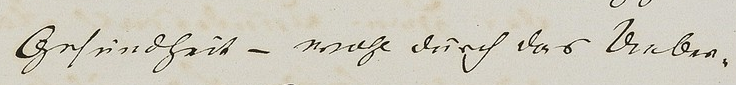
Gesundheit – wohl durch das Ueber-
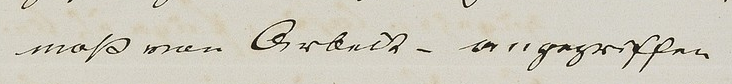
maß von Arbeit – angegriffen
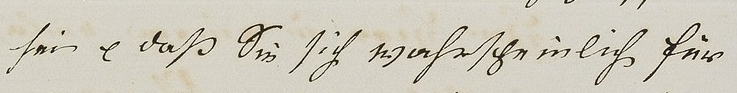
sei & daß Sie sich wahrscheinlich für
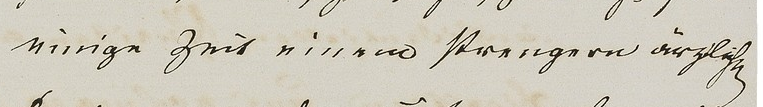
einige Zeit einem strengern ärztlichen
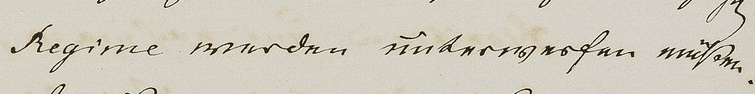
Regime werden unterwerfen müßen.
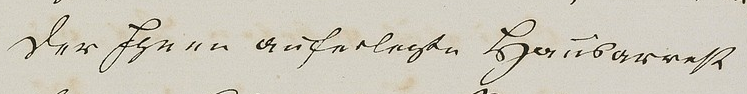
Der Ihnen auferlegte Hausarrest
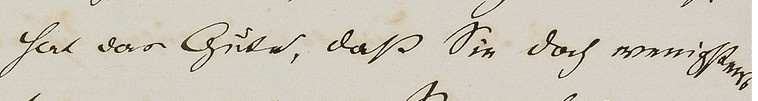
hat das Gute, daß Sie doch wenigstens
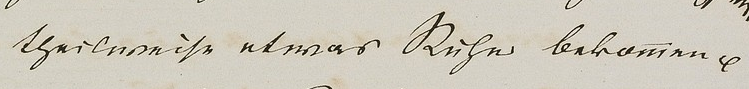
theilweise etwas Ruhe bekommen &
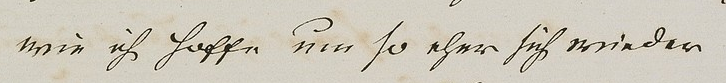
wie ich hoffe um so eher sich wieder
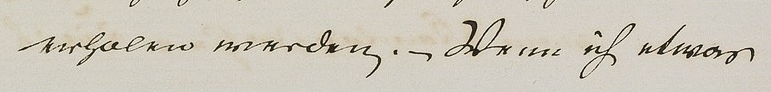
erholen werden. – Wenn ich etwas
